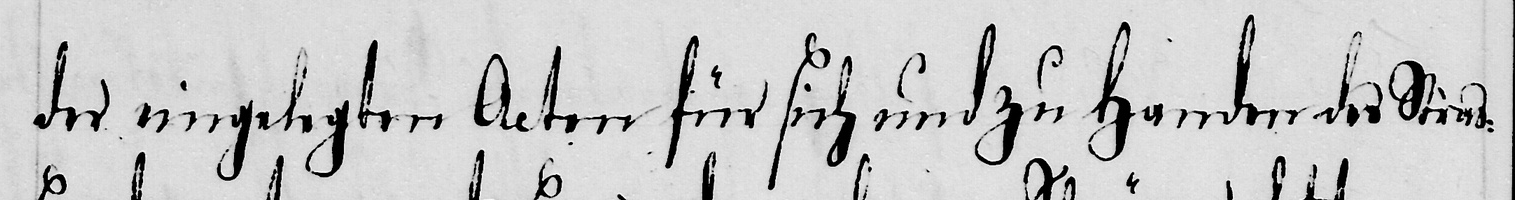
der eingelegten Acten für sich und zu Handen des Stra¬
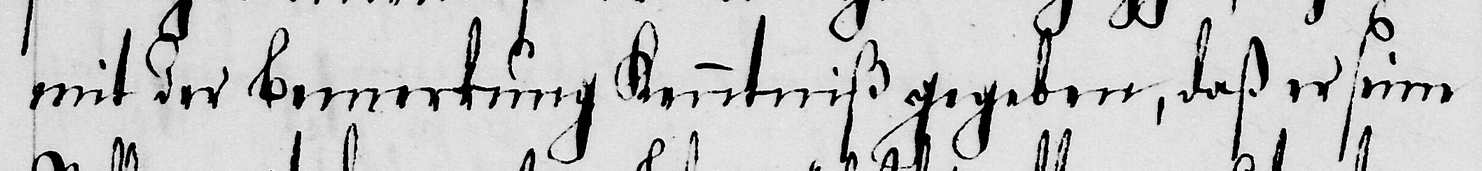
mit der Bemerkung Kenntniß gegeben, daß er seine
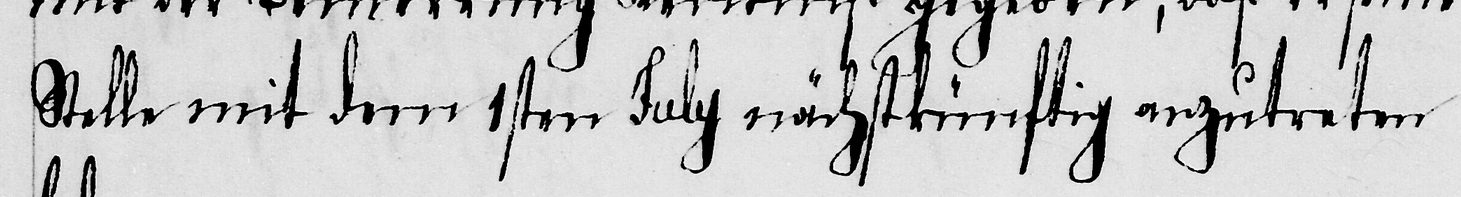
Stelle mit dem 1sten July nächstkünftig anzutreten
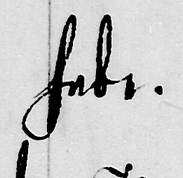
habe.
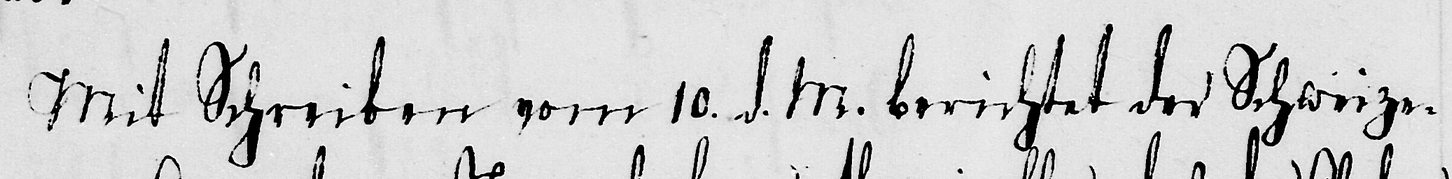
Mit Schreiben vom 10. d. M. berichtet der Schweize¬
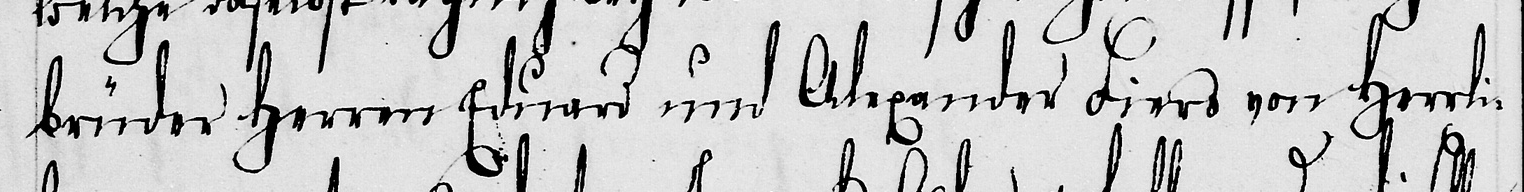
brüder Herren Eduard und Alexander Fiers von Herrl¬
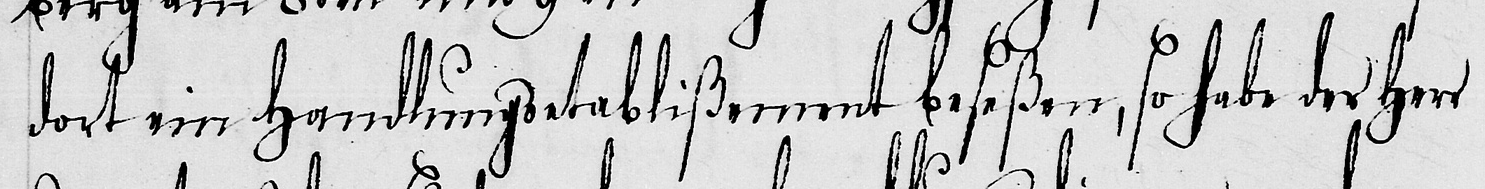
dort ein Handlungsetablißement beseßen, so habe der
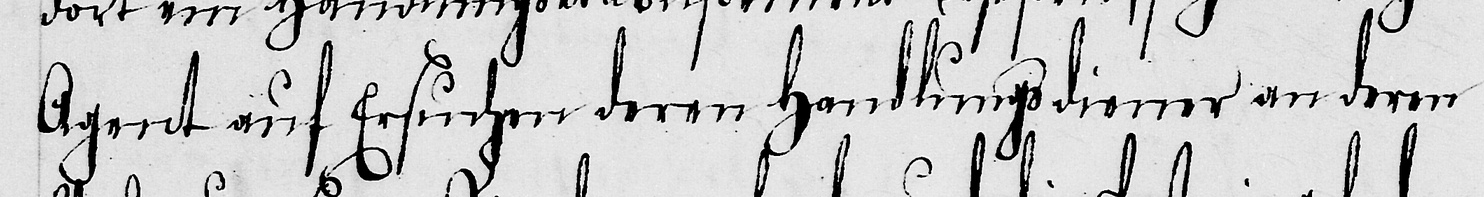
Agent auf Ersuchen deren Handlungsdiener an deren
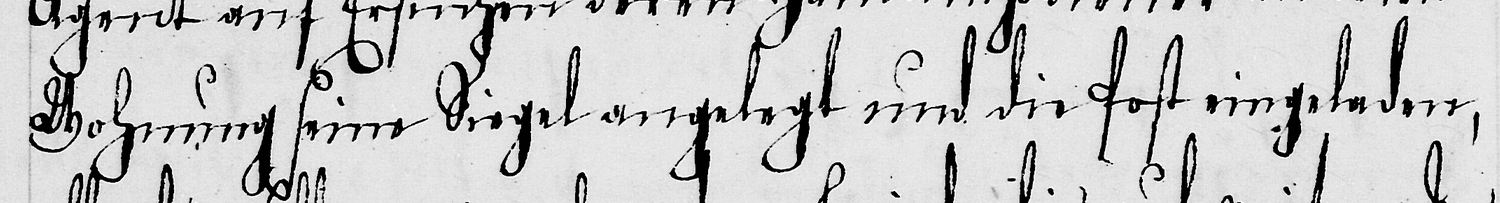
Wohnung seine Siegel angelegt und die Post eingeladen,
